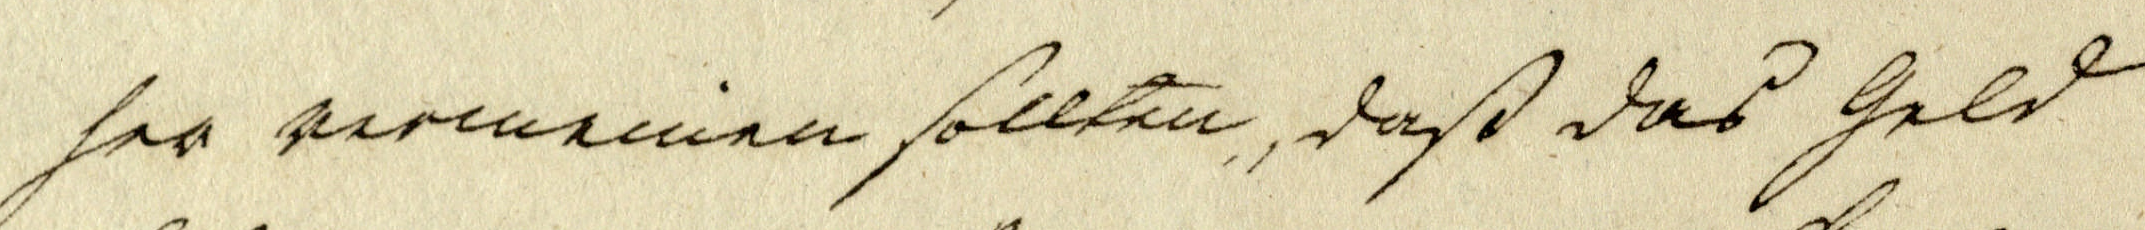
her vermeinen sollten, daß das Geld
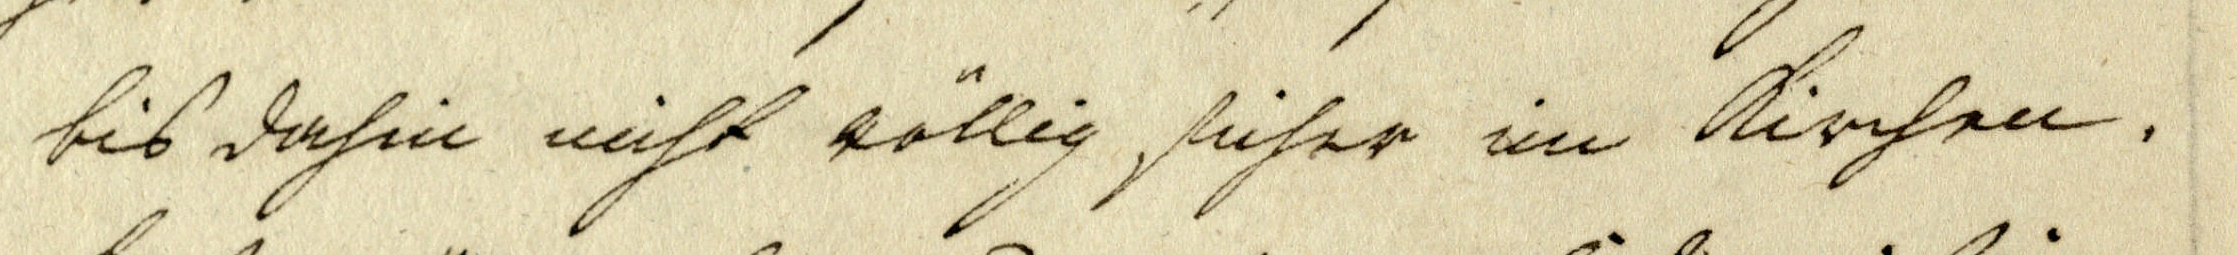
bis dahin nicht völlig sicher im Kirchen¬
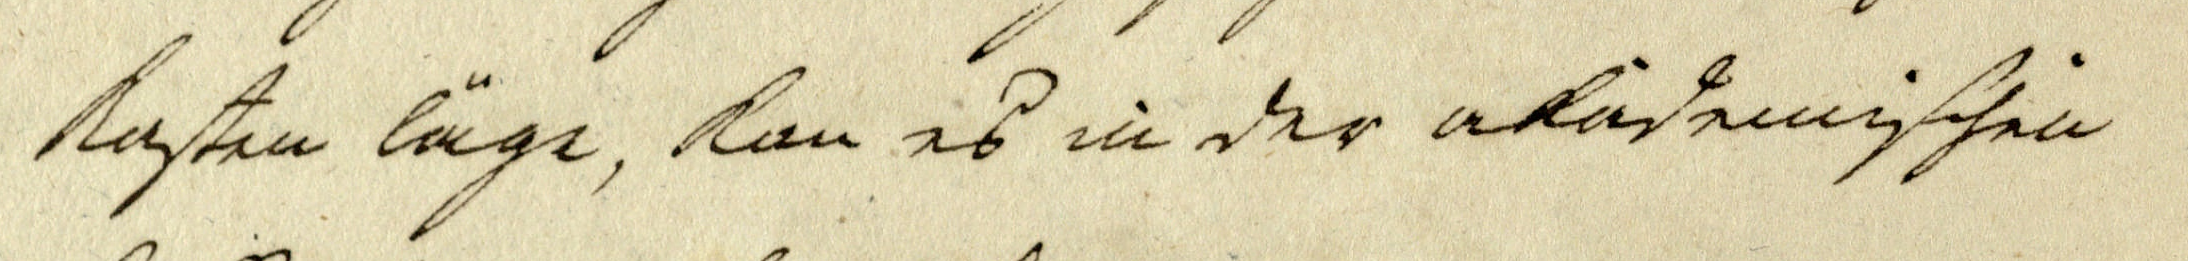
Kasten läge, kan es in der akademischen
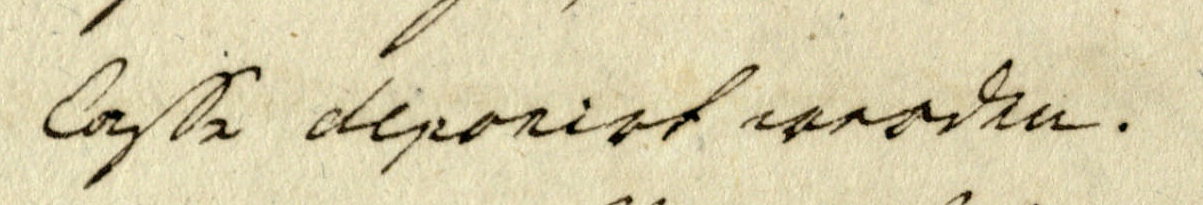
Casse deponirt werden.
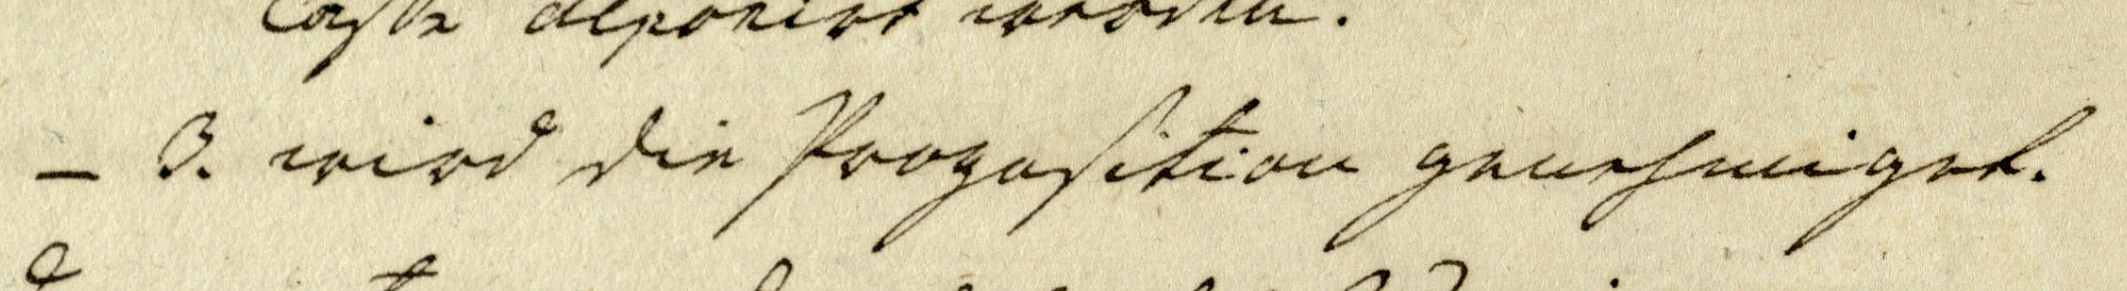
3. wird die Proposition genehmiget.
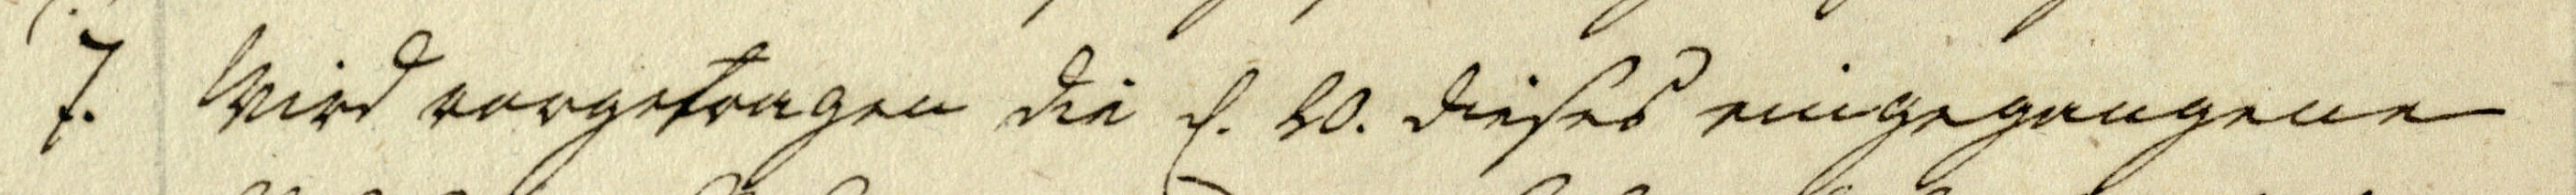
7. Wird vorgetragen die d. 20. dieses eingegangene
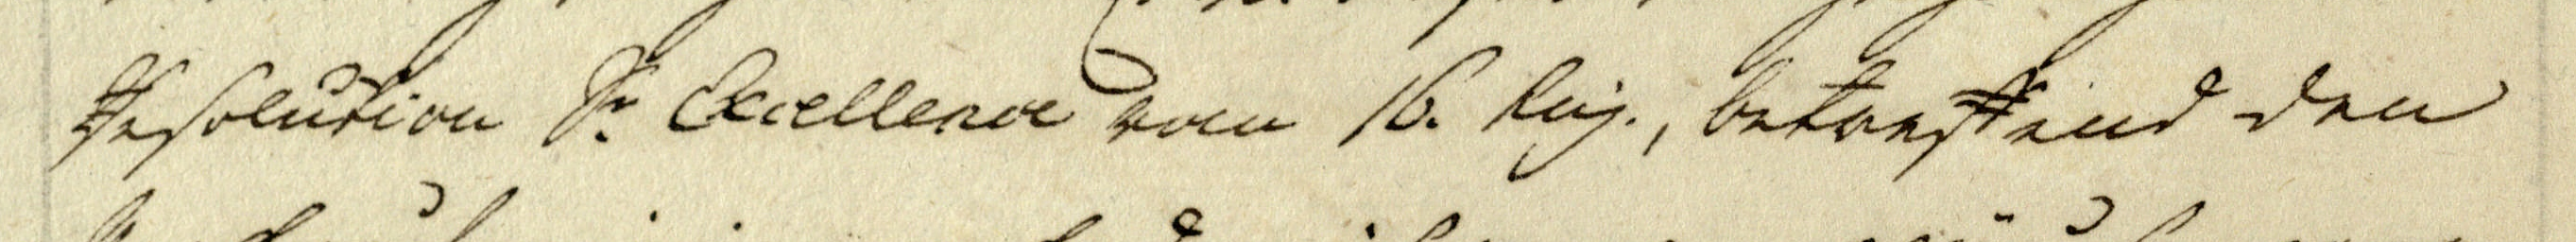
Resolution Sr Excellence vom 16. huj., betreffend den
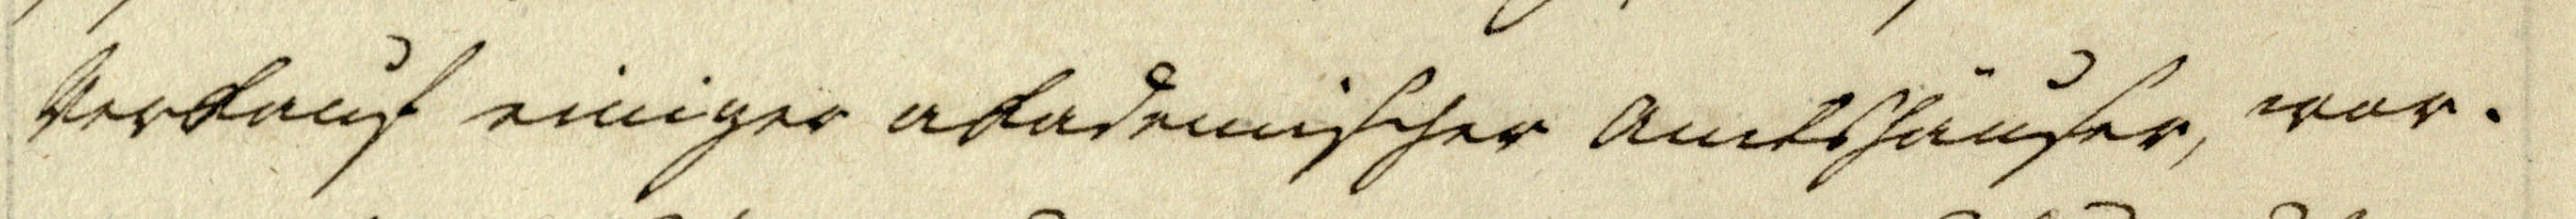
Verkauf einiger Akademischer Amtshäuser, wor¬
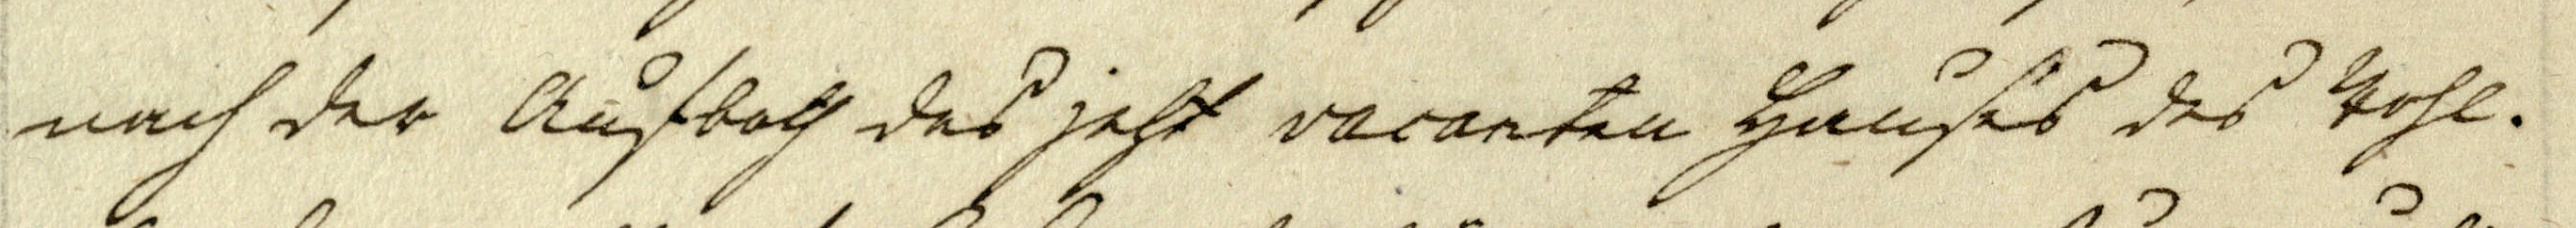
nach der Aufboth des jetzt vacanten Hauses des Wohl¬
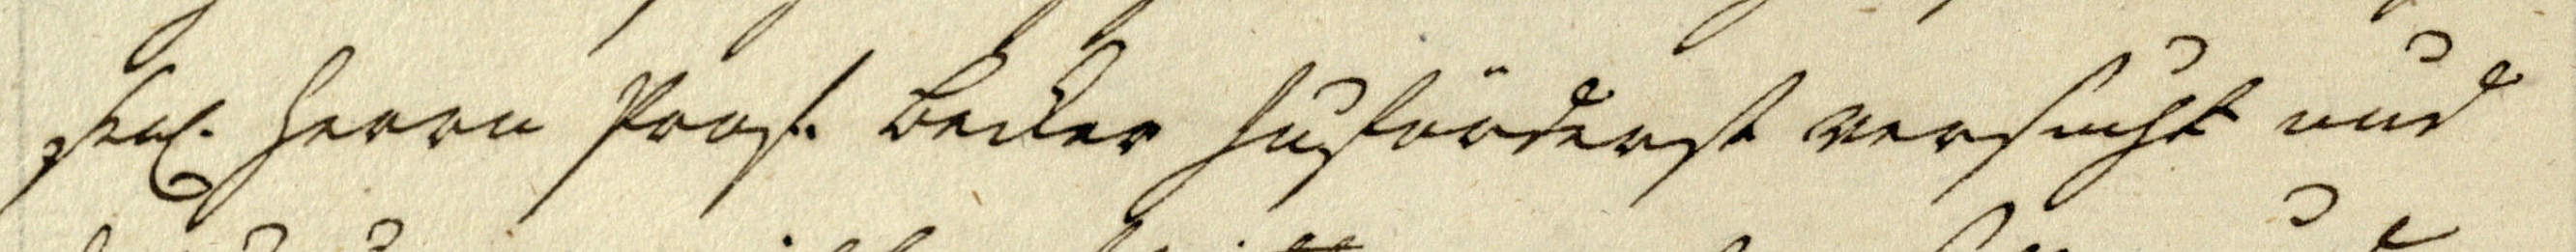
seel. Herrn Prof. Becker zuförderst versucht und
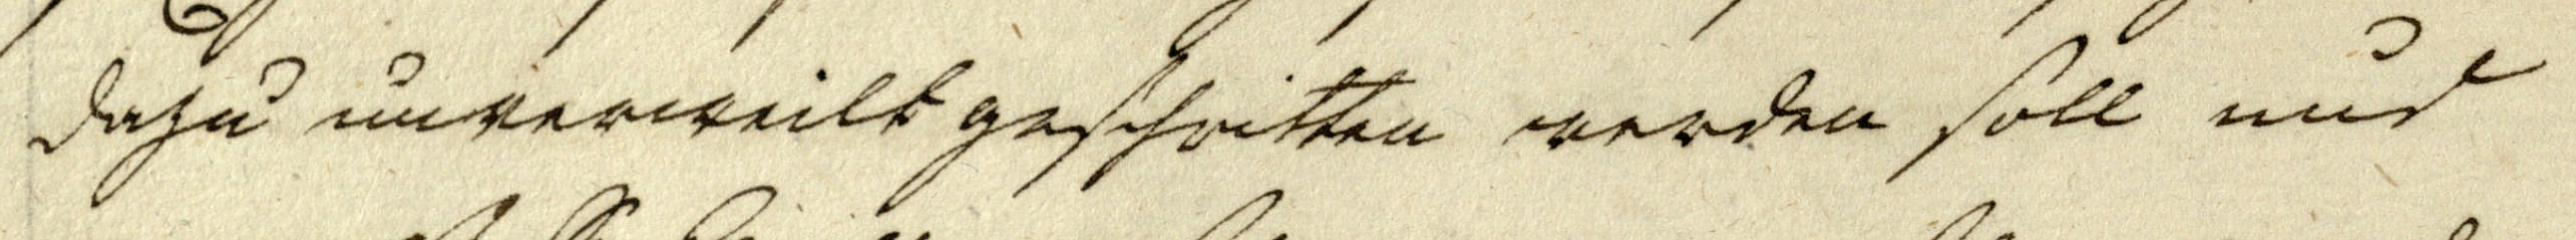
dazu unverweilt geschritten werden soll und
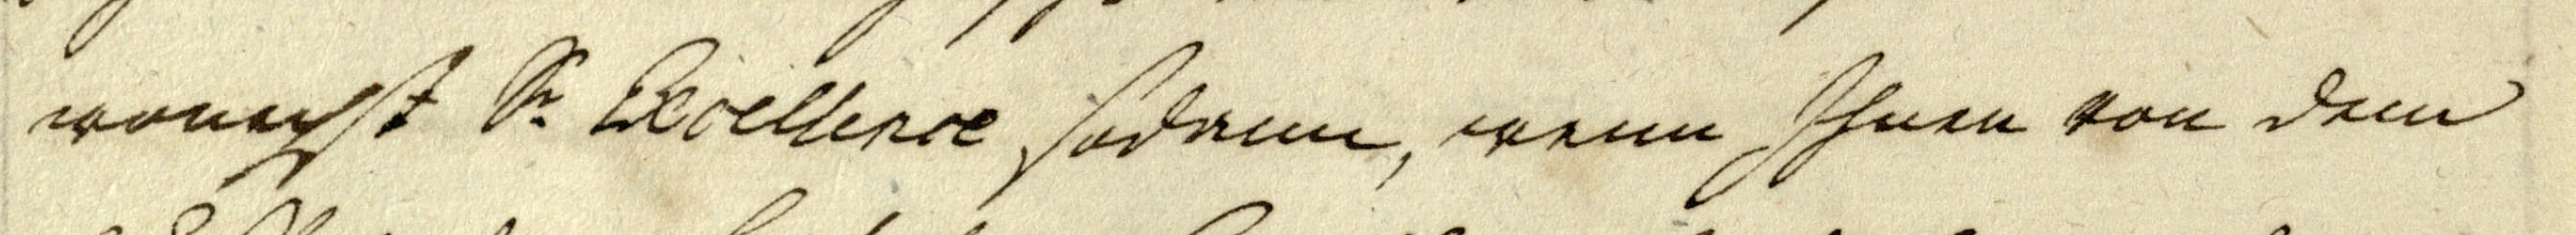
wonechst Sr Excellence sodann, wenn Ihnen von dem
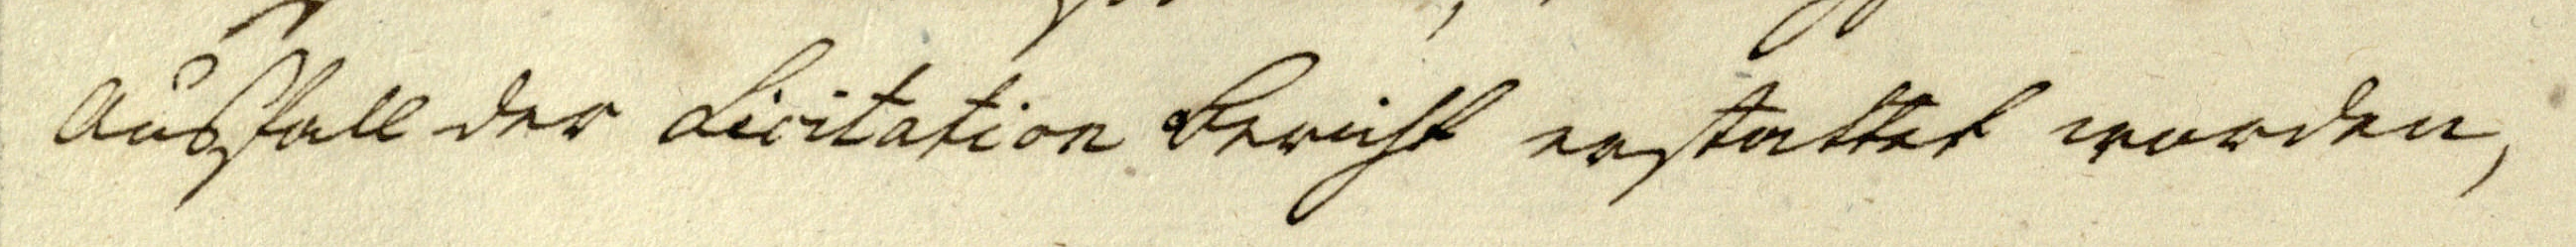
Ausfall der Licitation Bericht erstattet worden,
